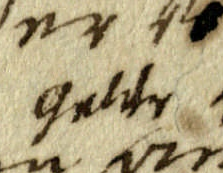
Gelder
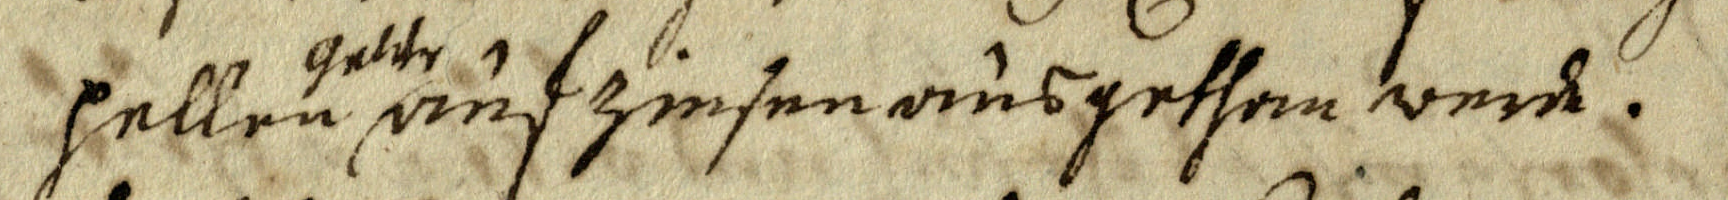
pellen auf Zinsen ausgethan werde.
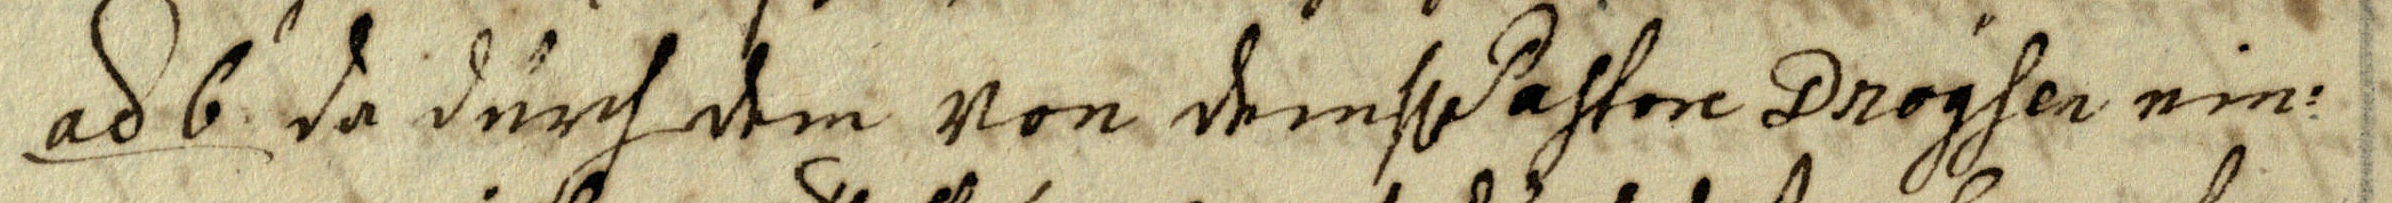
ad 6. da durch dem von dem H Pastore Droÿsen ein¬
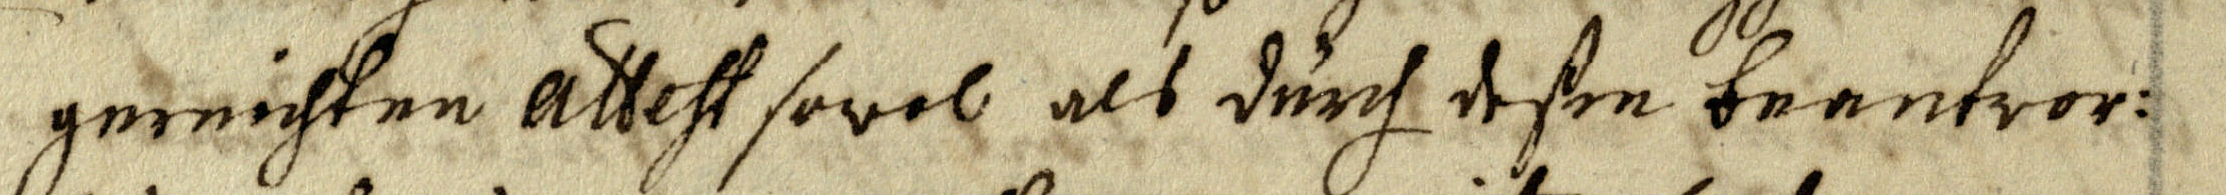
gereichten Attest sowol als durch deßen Beantwor¬
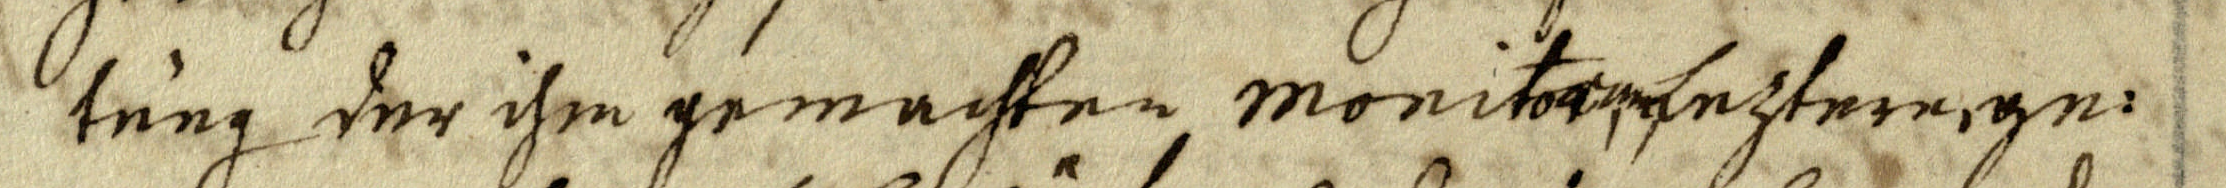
tung der ihm gemachten Monitorum leztere ge¬
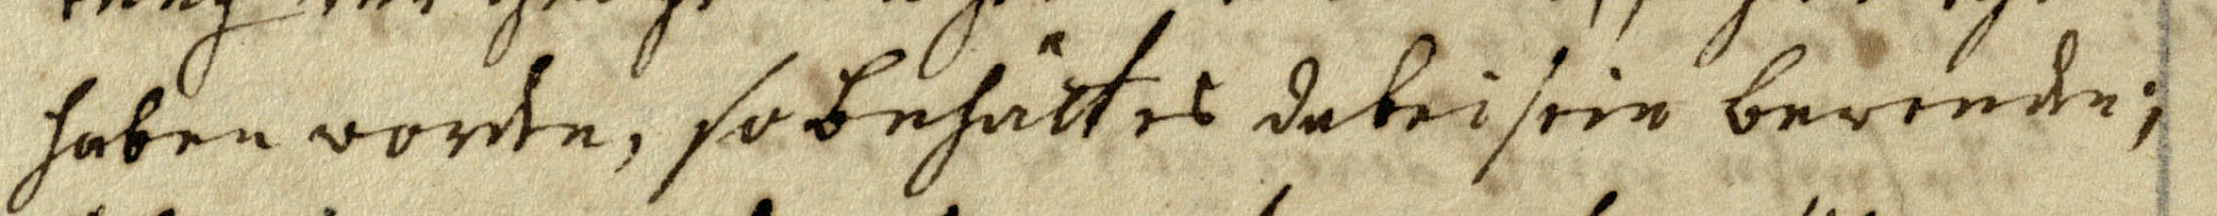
hoben worden, so behält es dabei sein Bewenden;
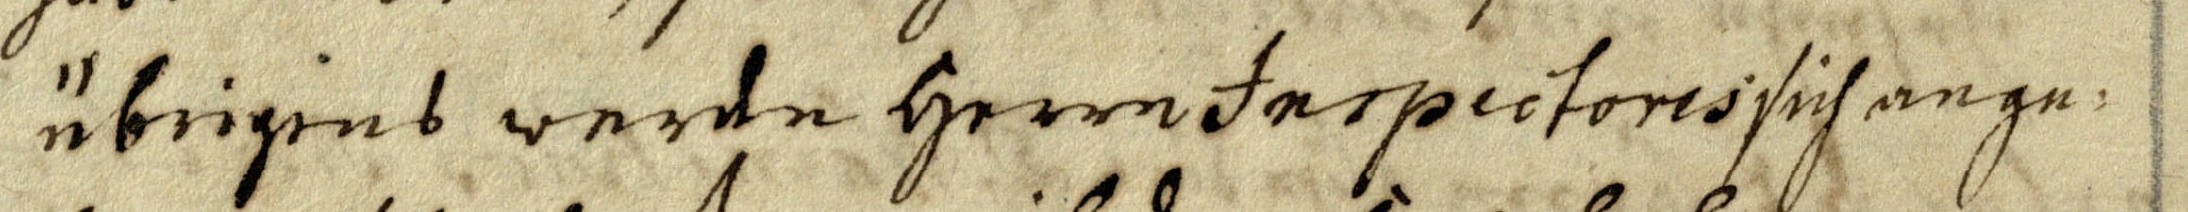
übrigens werden Herrn Inspectores sich ange¬
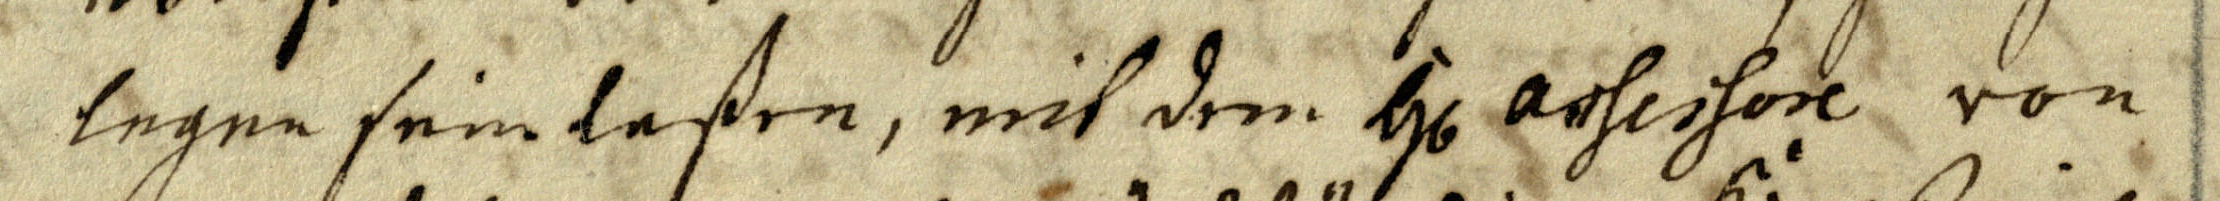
legen sein laßen, mit dem H Assessore von
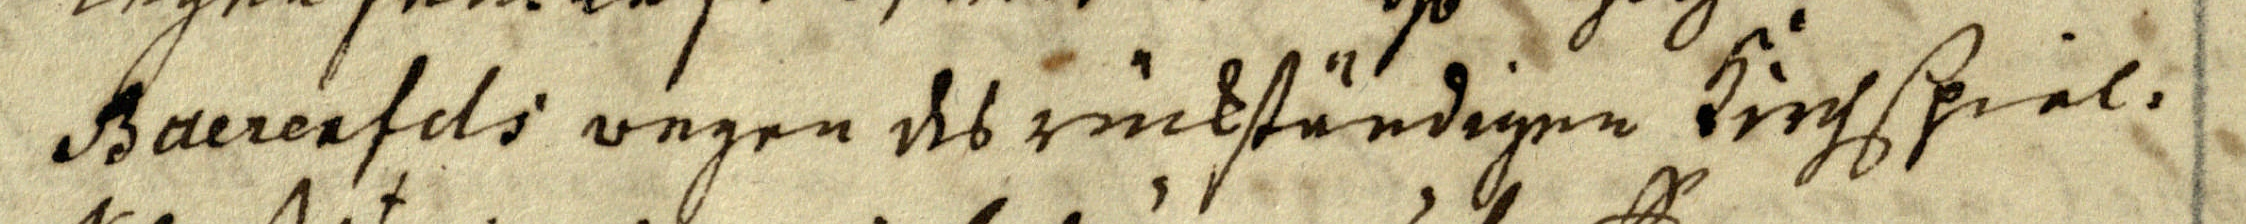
Baerenfels wegen des rückständigen Kirchspiel¬
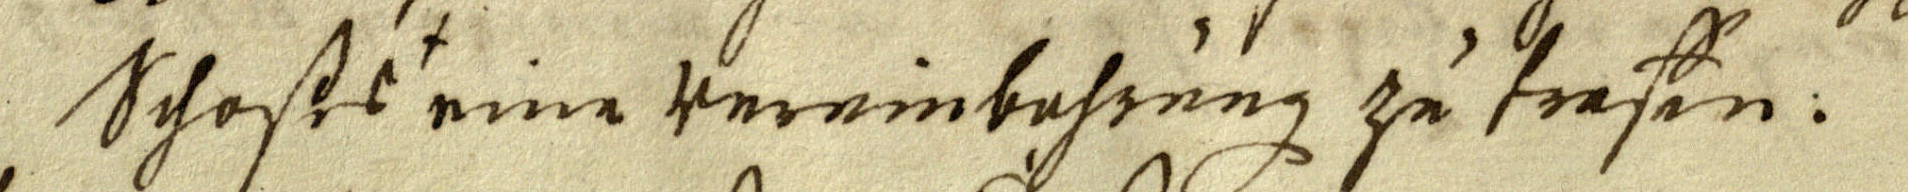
Schoßes + eine Vereinbahrung zu treffen.
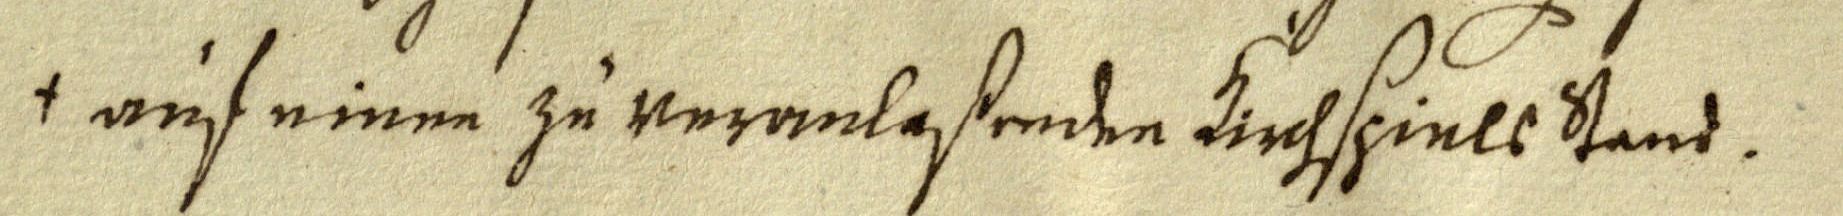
+ auf einen zu veranlaßenden Kirchspiels Stand.
